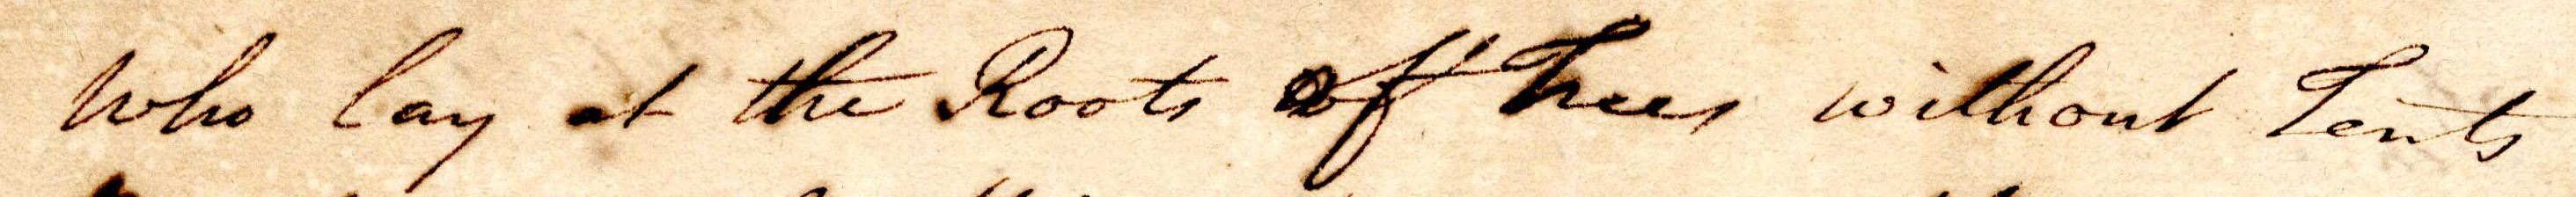who lay at the Roots of Trees without Tents
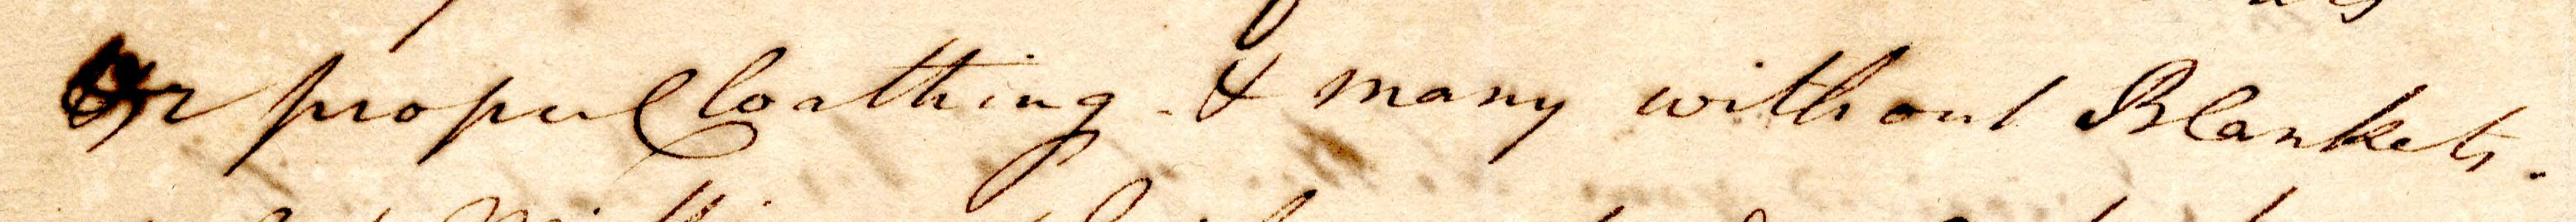or proper Cloathing & many without Blankets.
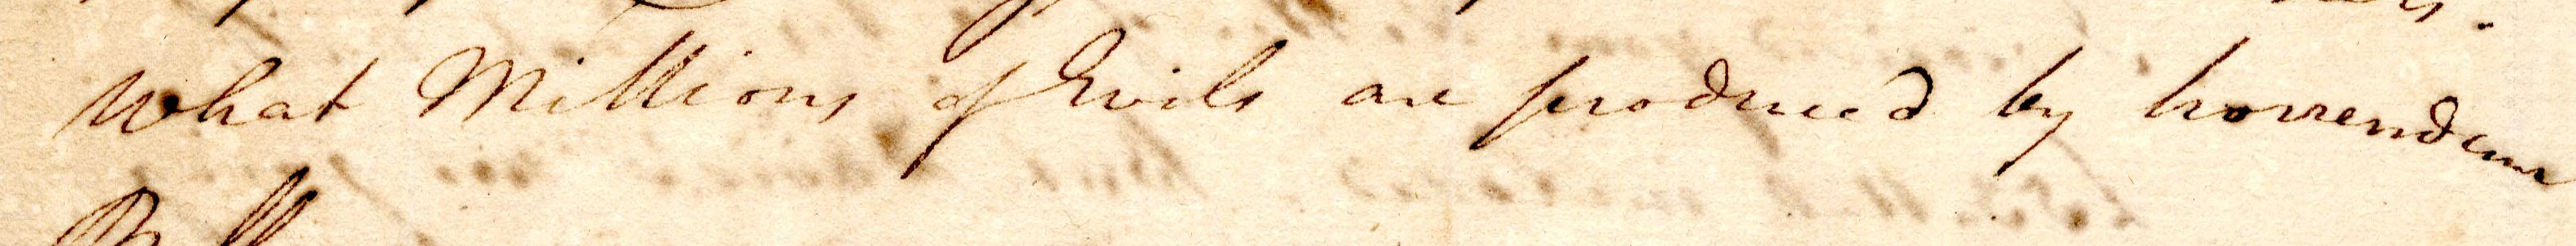What Millions of Evils are produced by horrendous
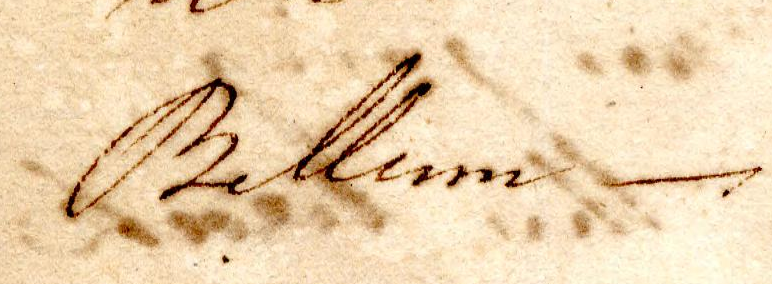Bellum-
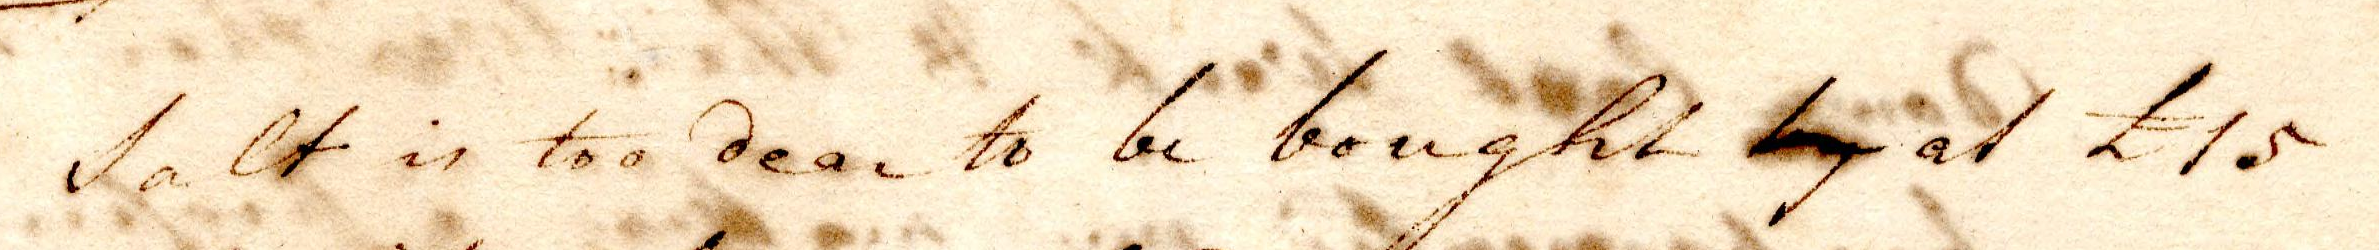Salt is too dear to be bought by at £15
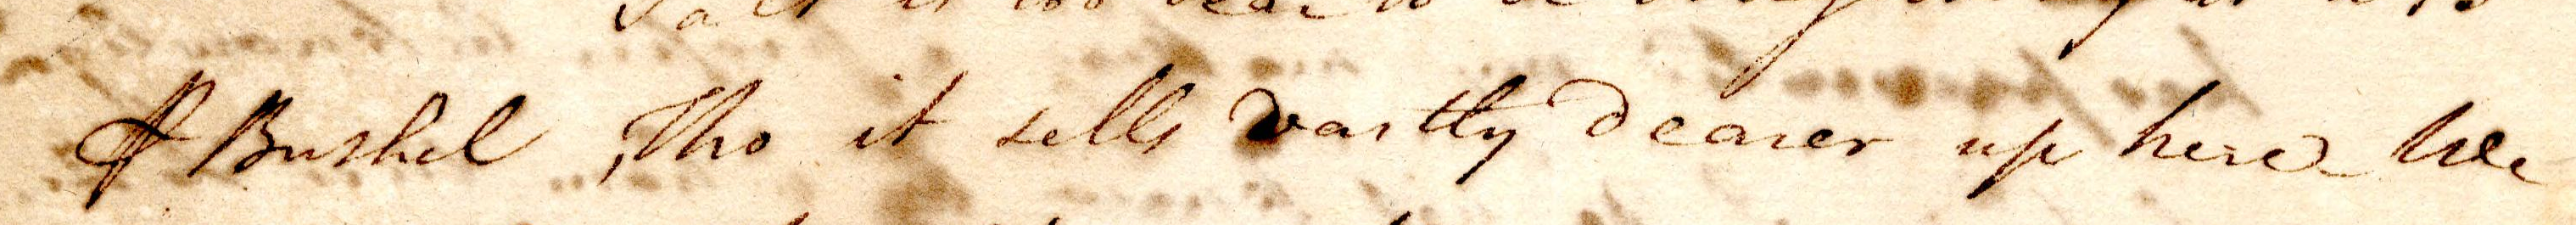per Bushel tho it sells vastly dearer up here- We
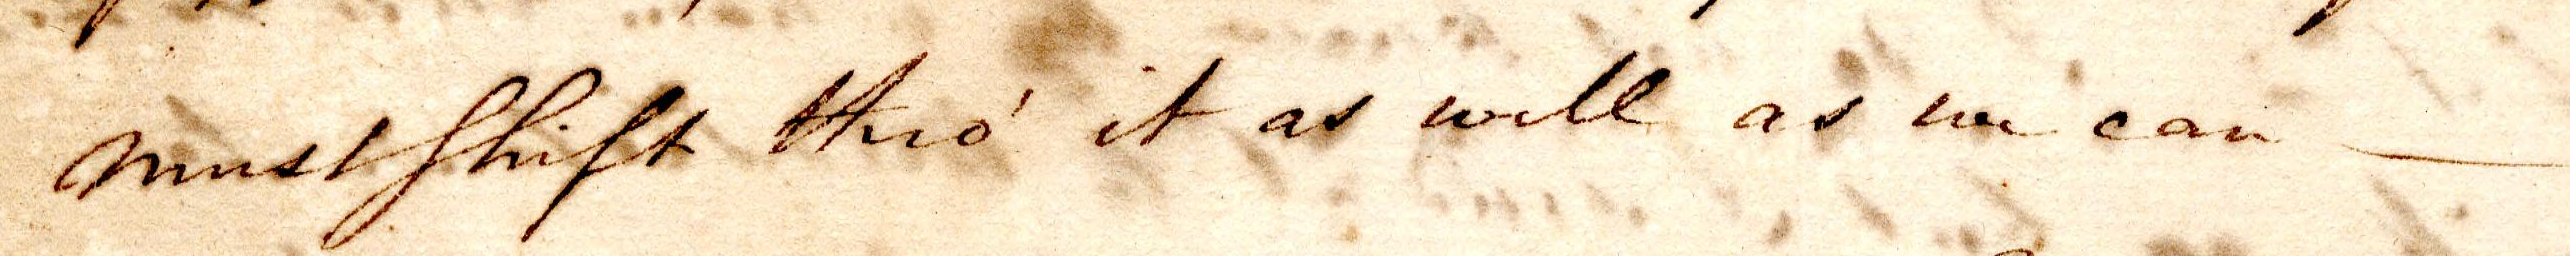must shift thro' it as well as we can-
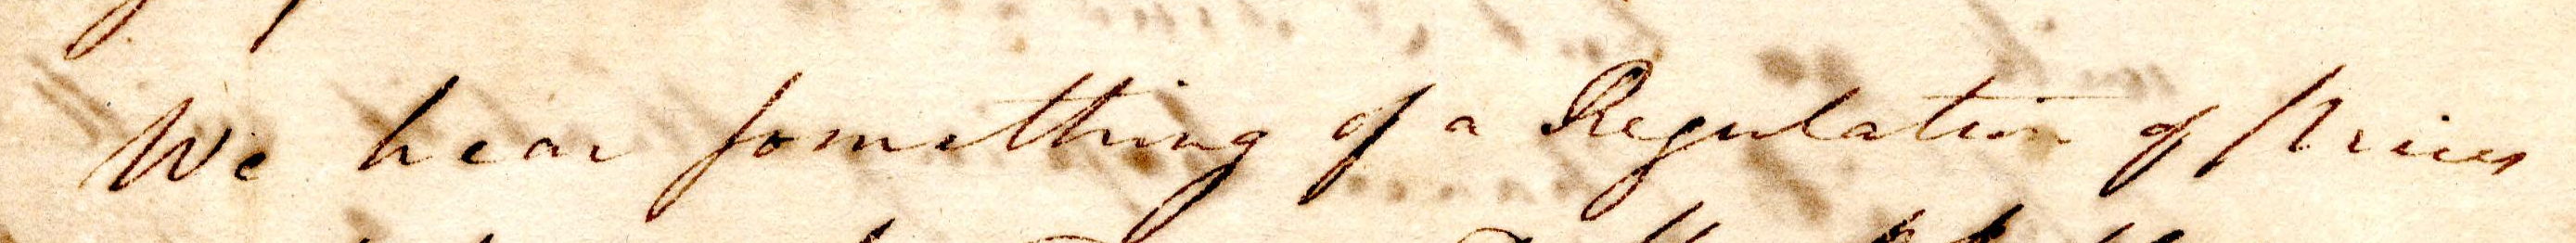We hear something of a Regulation of prices
